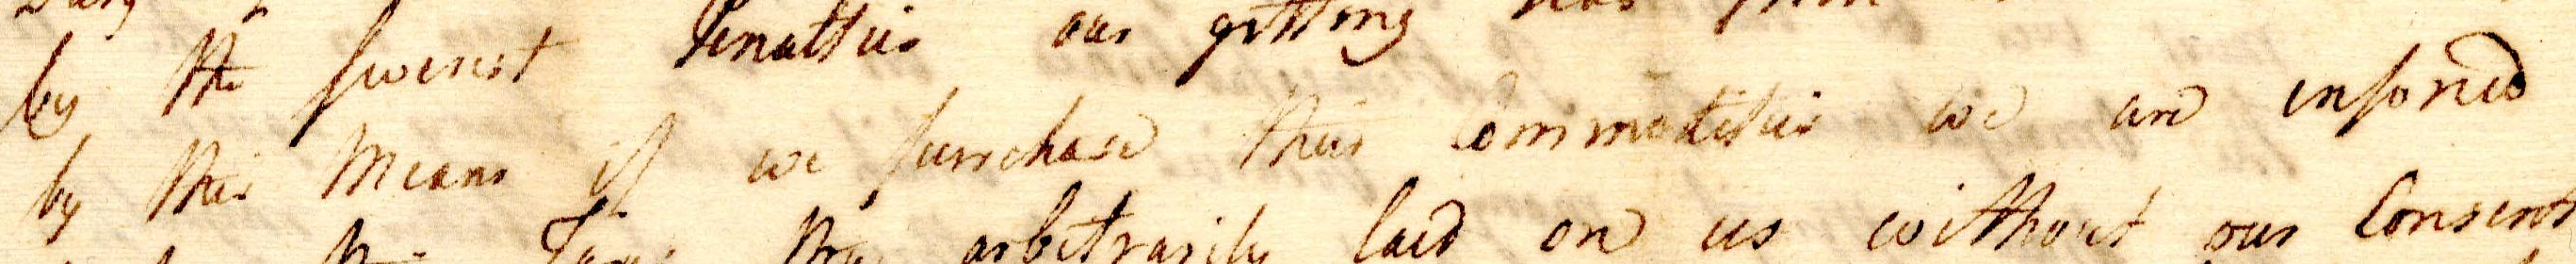by the Means if we purchase their commodities we are enforced
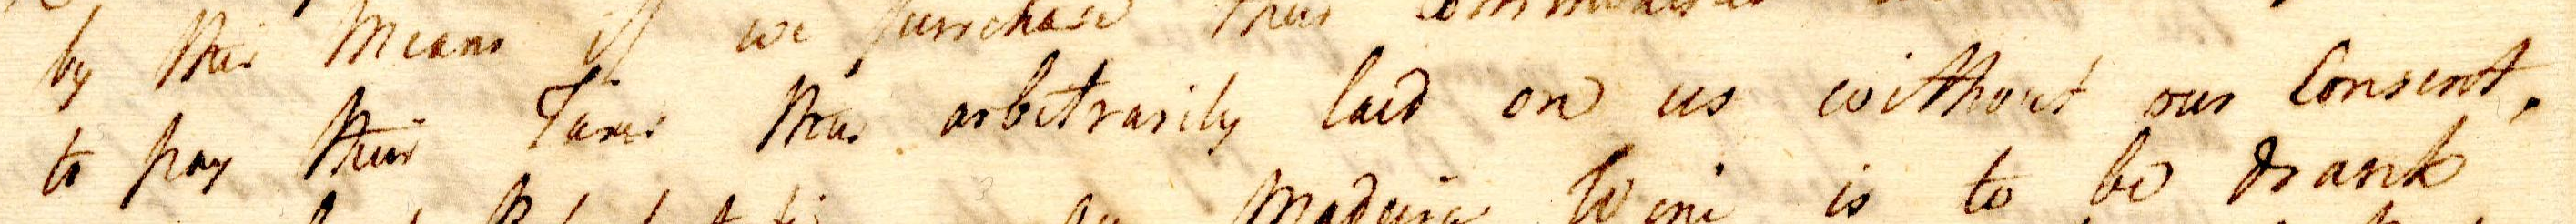to pay their Taxes thus arbitrarily laid on us without our Consent.
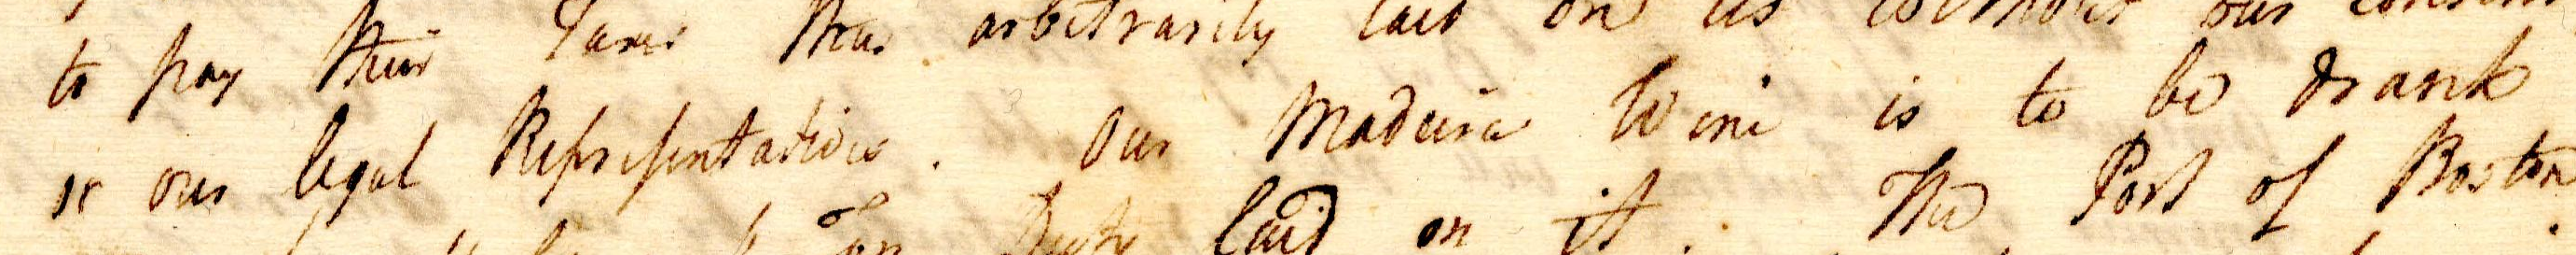or our legal Representatives. Our Madeira Wine is to be drank
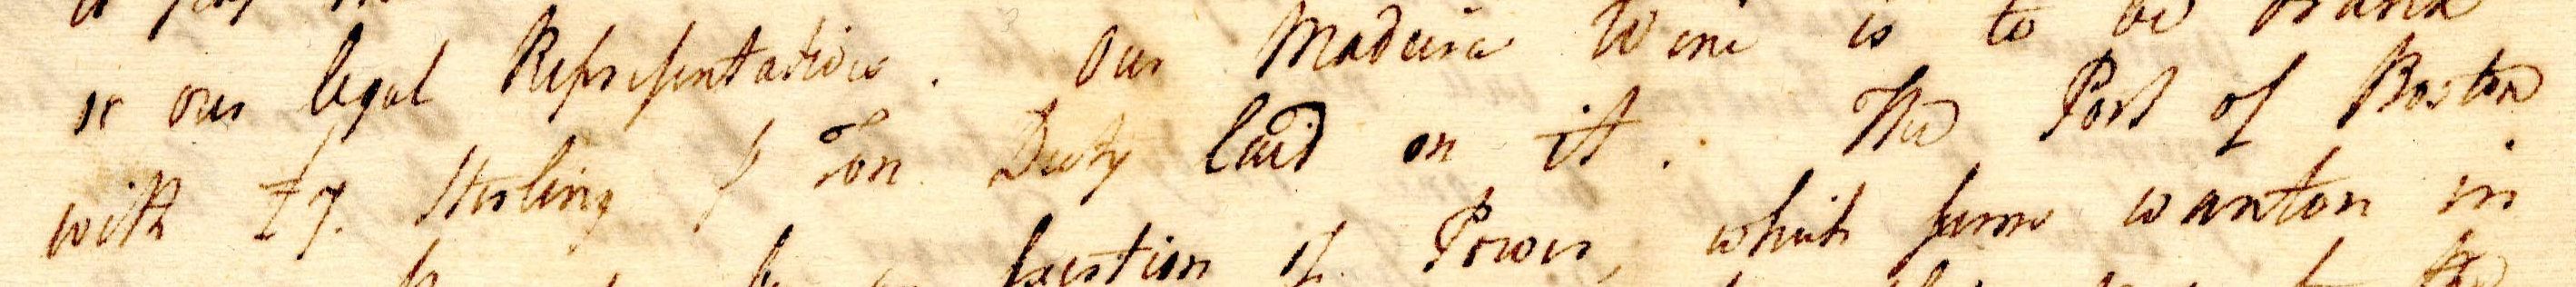with £7 sterIing per Ton Duty laid on it. The Port of Boston
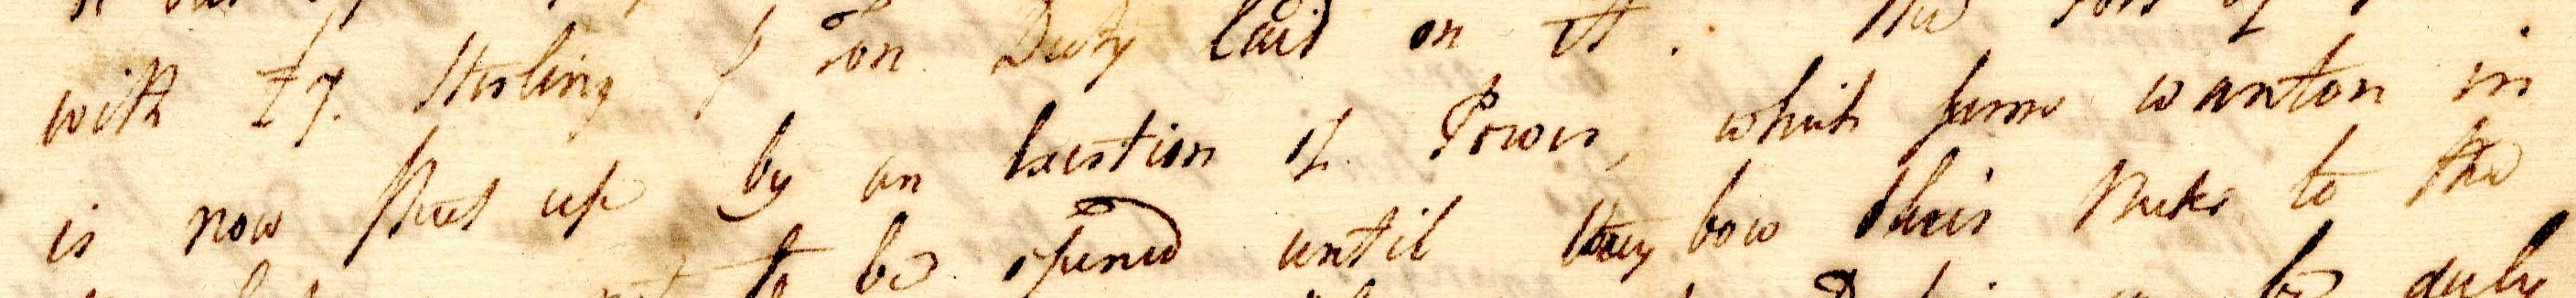is now shut up by an Exertion of Power, which from wanton in
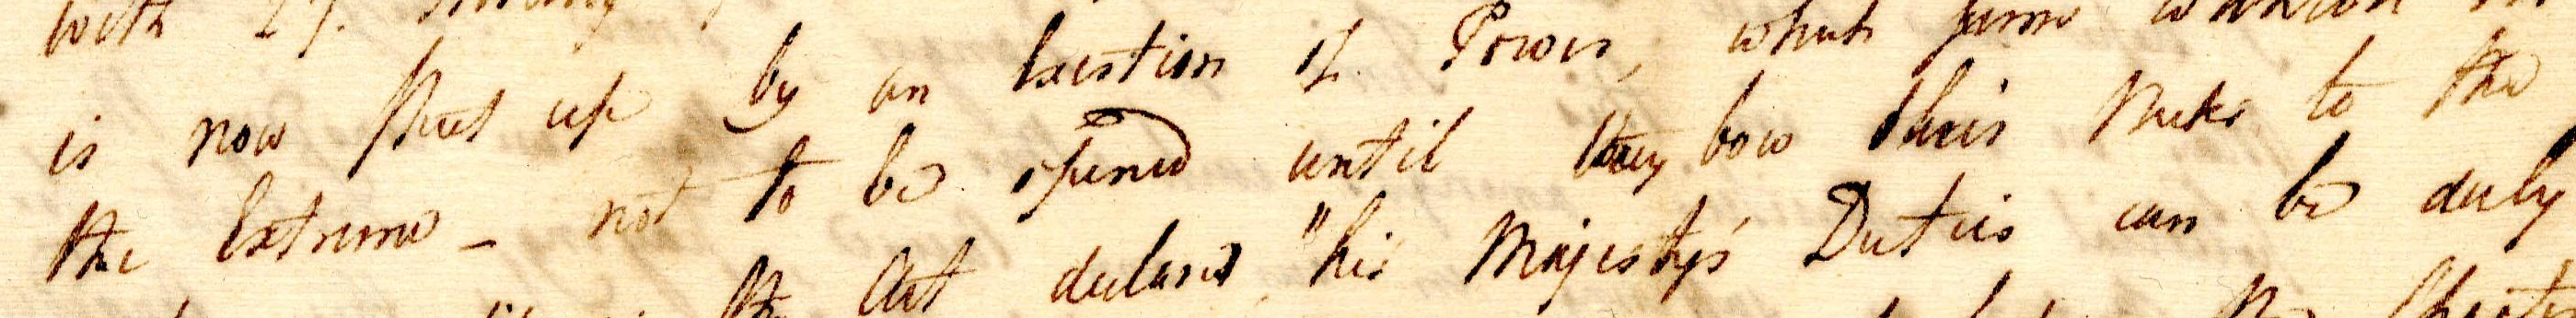the Extreme- not to be opened until they bow their necks to the
